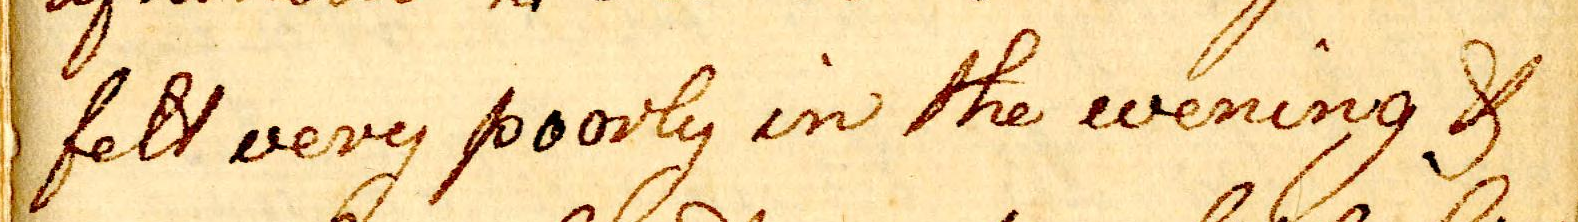felt very poorly in the evening &
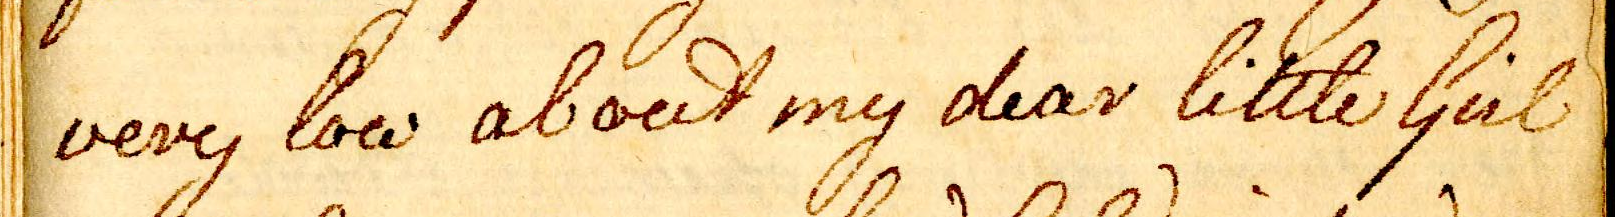very low about my dear little Girl
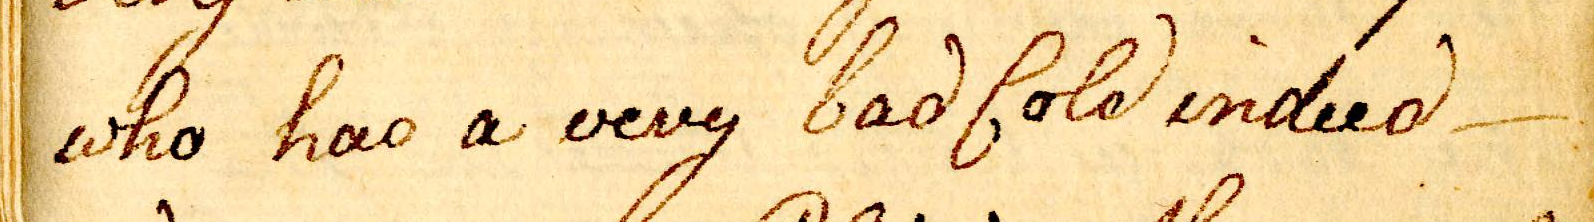who has a very bad Cold indeed
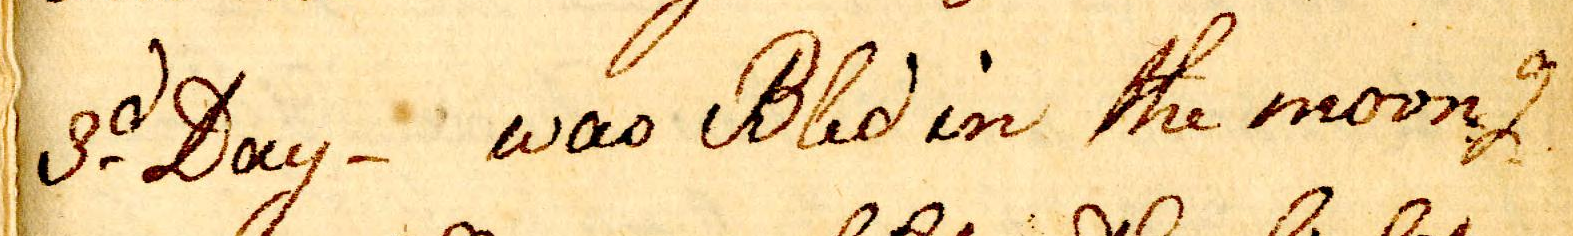3^d. Day- was Bled in the morn^g
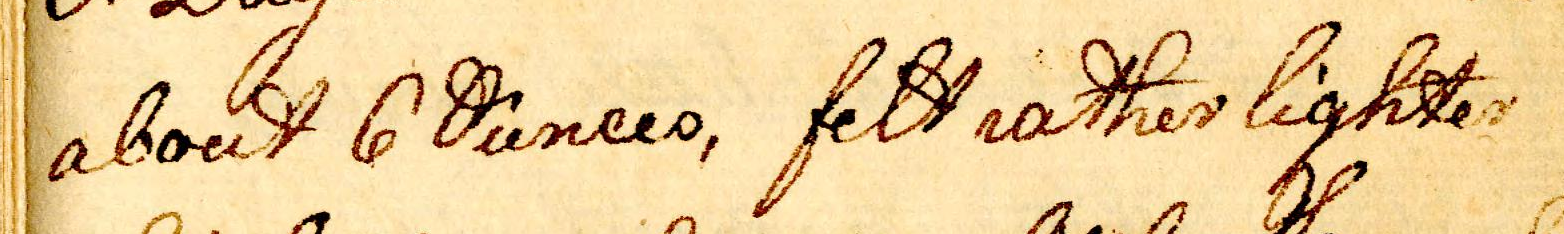about 6 Ounces, felt rather lighter
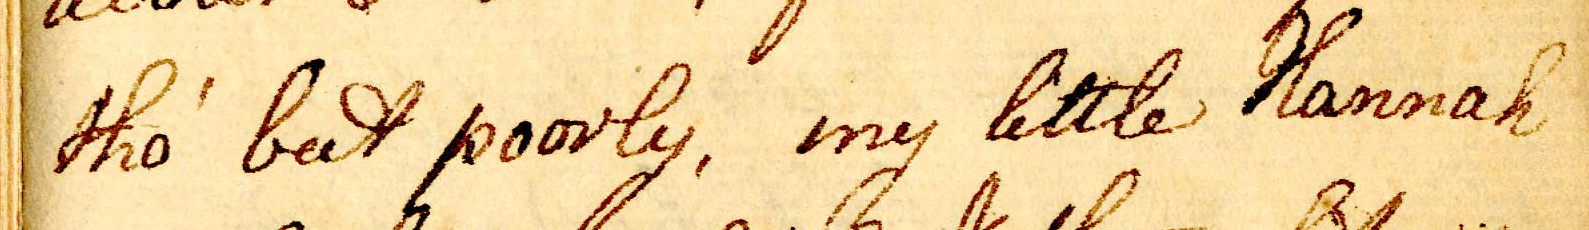tho' but poorly, my little Hannah
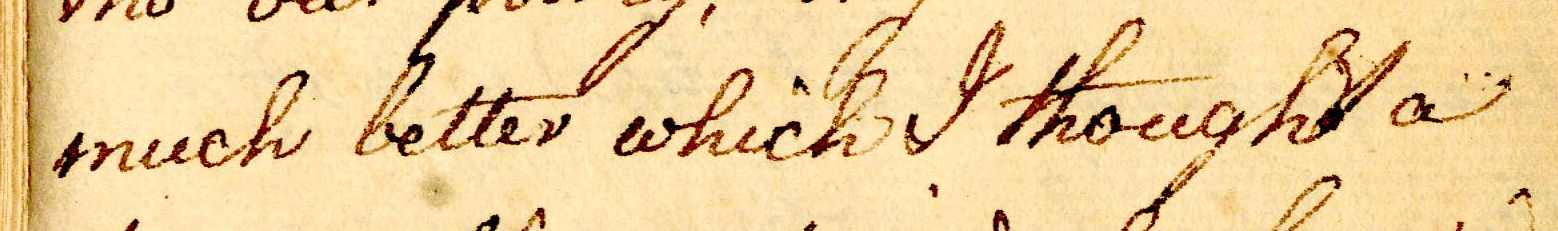much better which I thought a
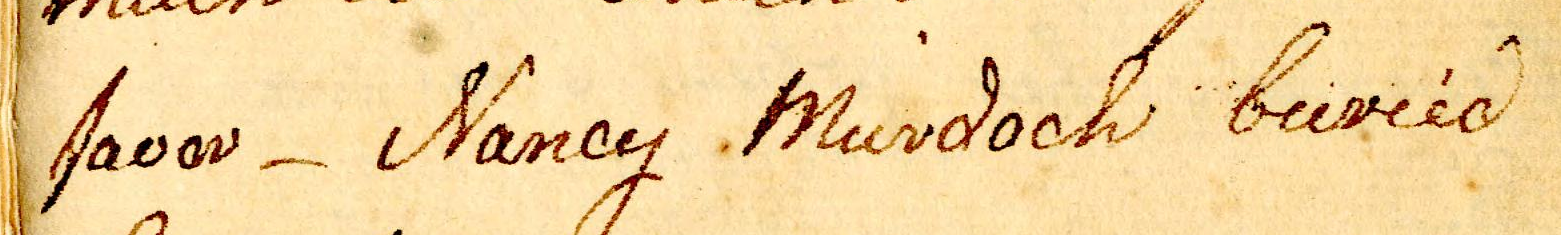favor- Nancy Murdoch buried
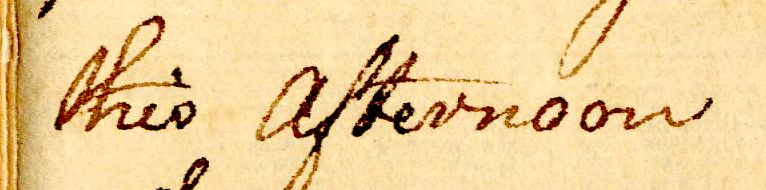this Afternoon
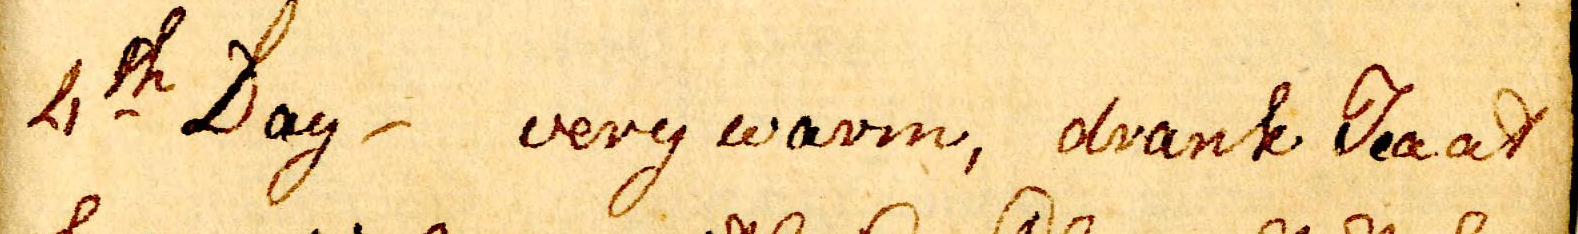4^th Day- very warm, drank Tea at
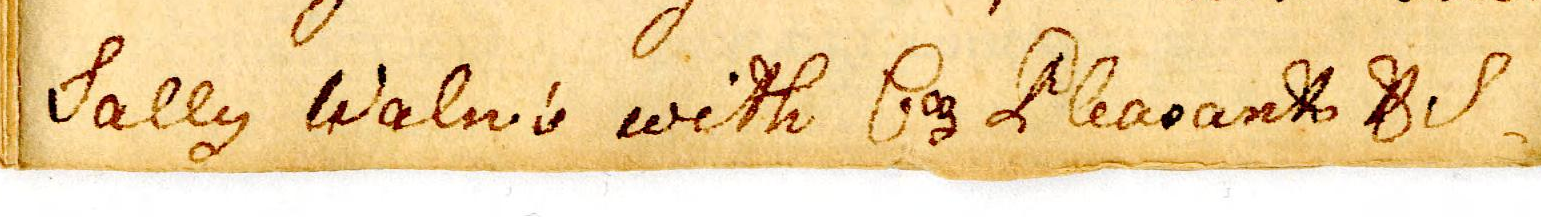Sally Waln's with Coz Pleasants & S
